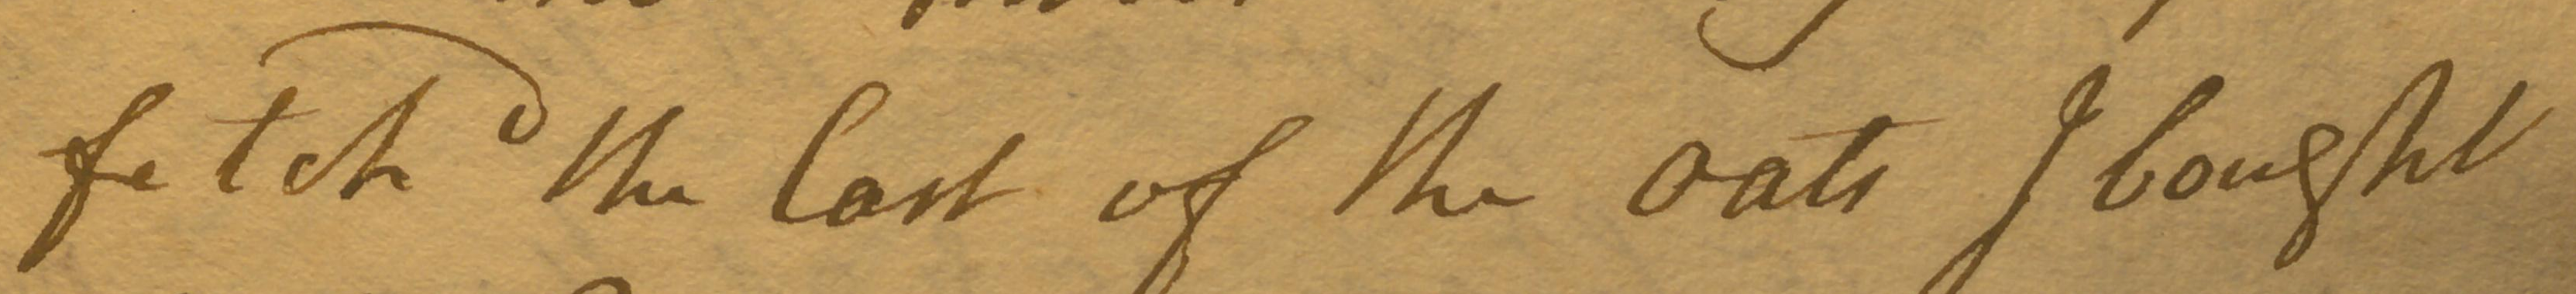fetch^d the last of the oats I bought
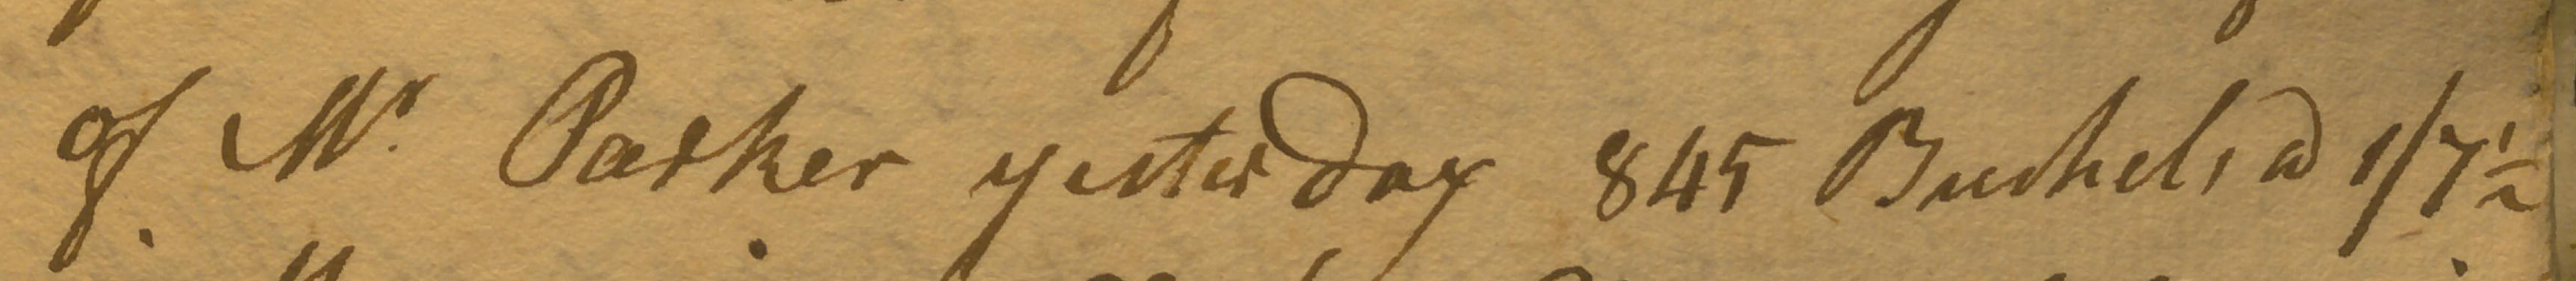of M^r. Parker yesterday 845 Bushels @ 1/ 7 1/2
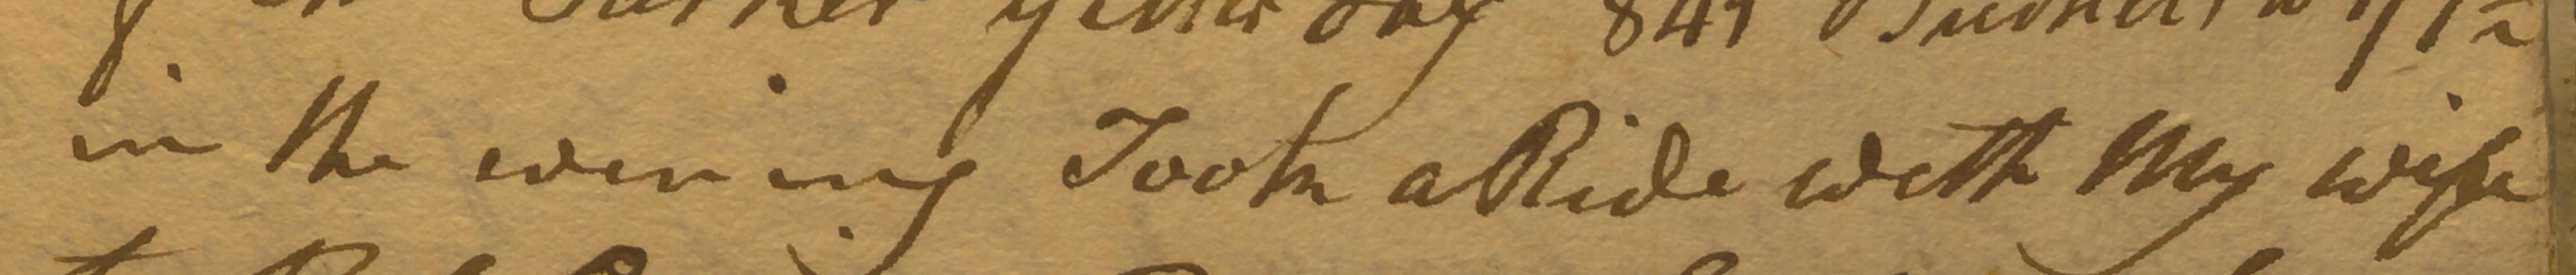in the evening Took a Ride with My wife
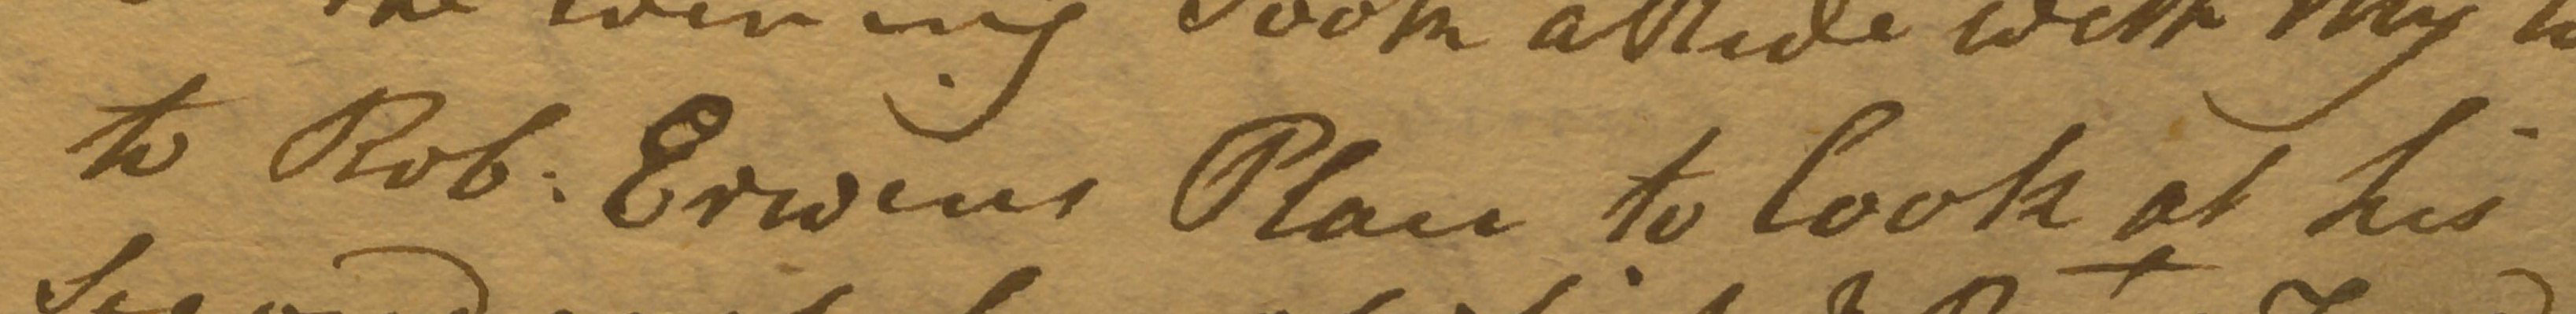to Robt. Erwins Place to look at his
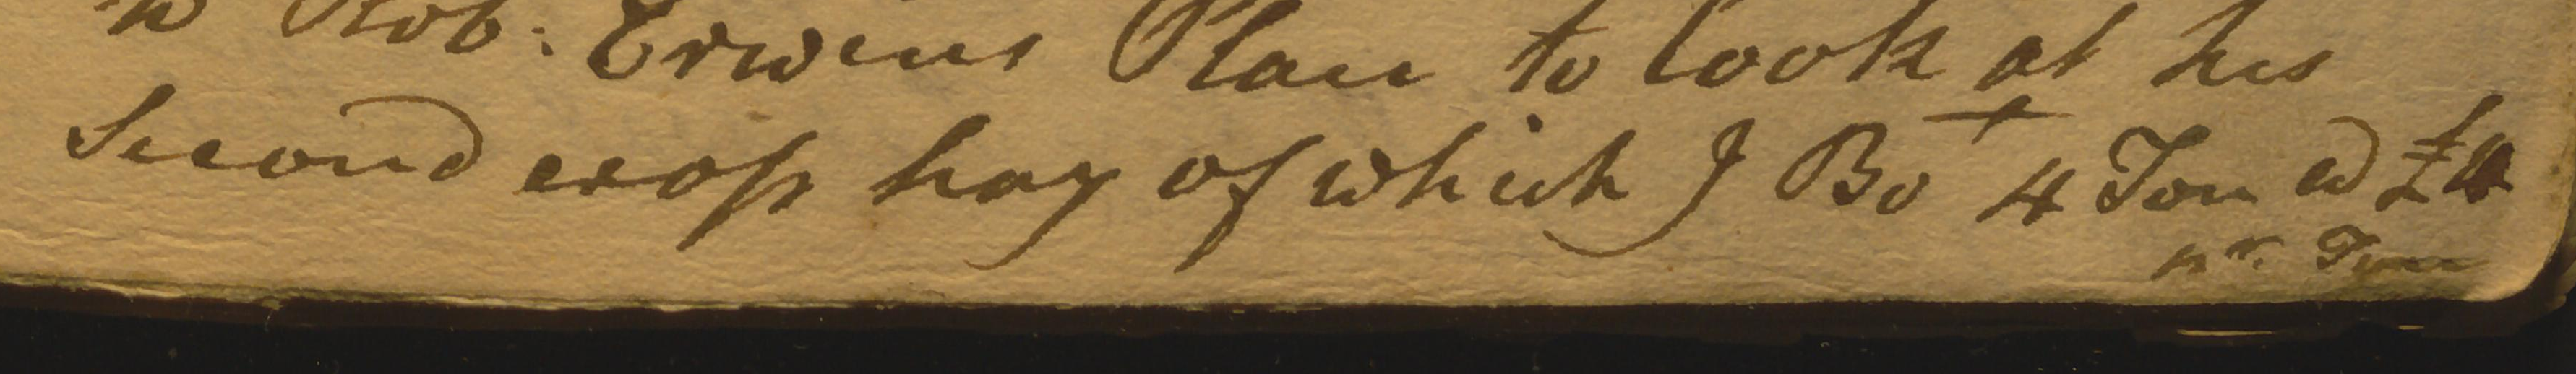second crop hay of which I Bo^t 4 Ton @ £4
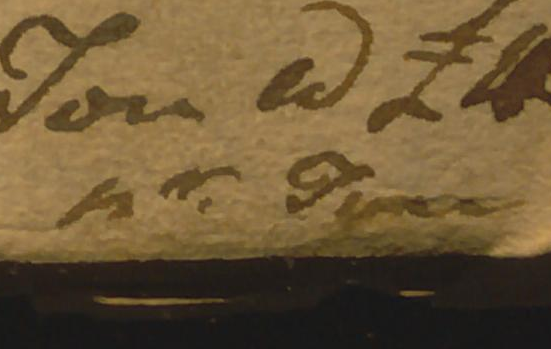p^r. Ton
